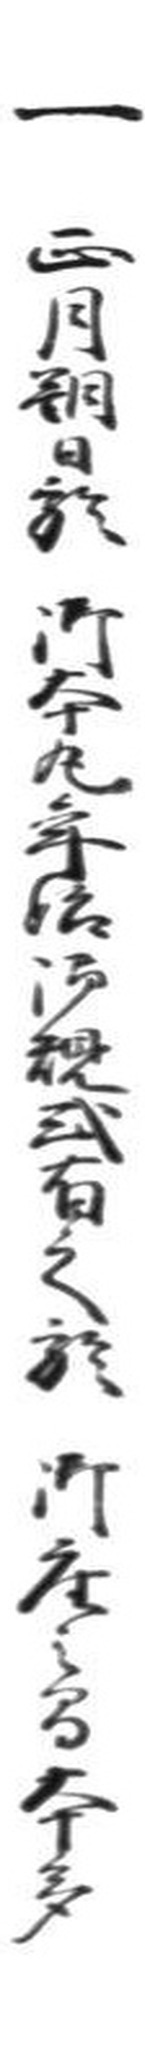一正月朔日於御本丸年始御規式有之於御座之間本多
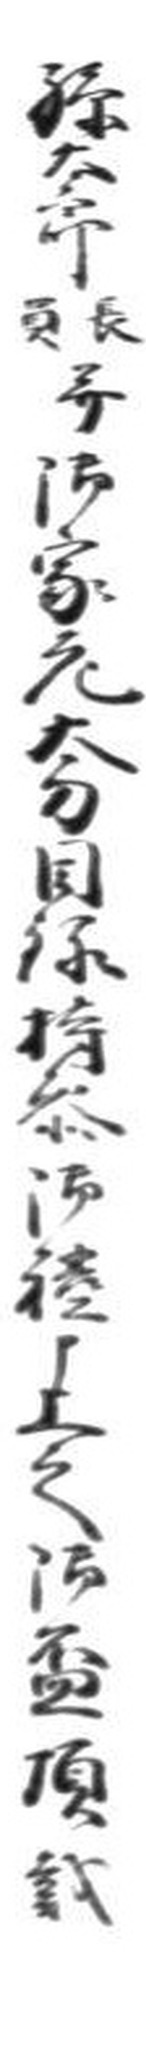孫太郎長員并御家老太刀目録持参御礼申上之御盃頂戴
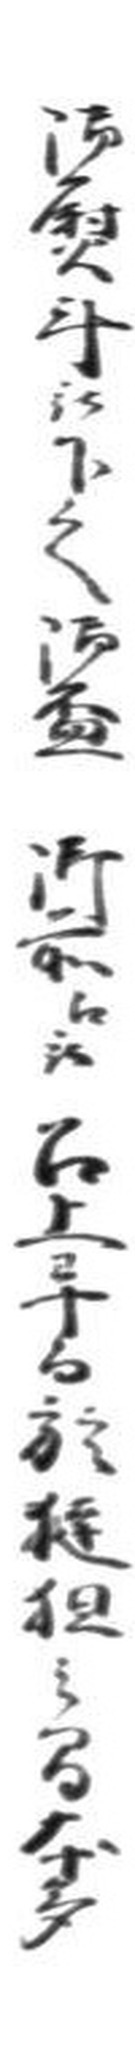御熨斗被下之御盃御前江被召上畢而於韃靼之間本多
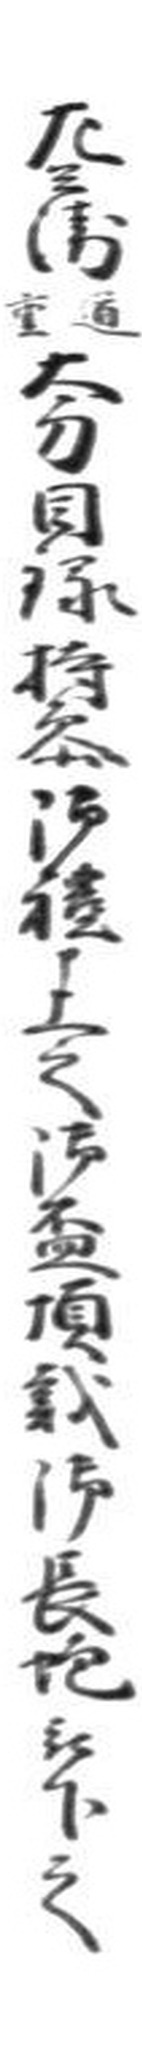左兵衛通重太刀目録持参御礼申上之御盃頂戴御長蚫被下之
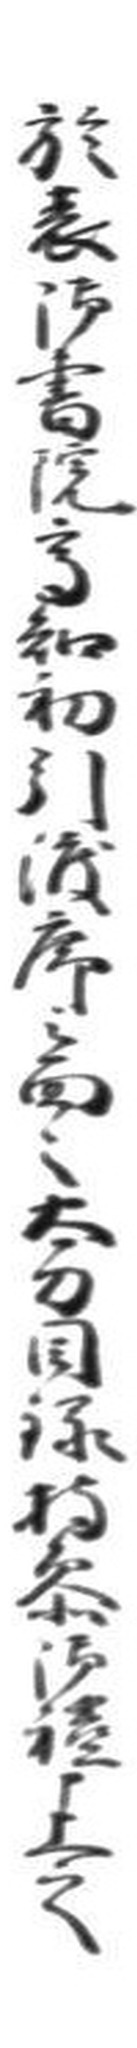於表御書院高知初引渡序之面々太刀目録持参御礼申上之
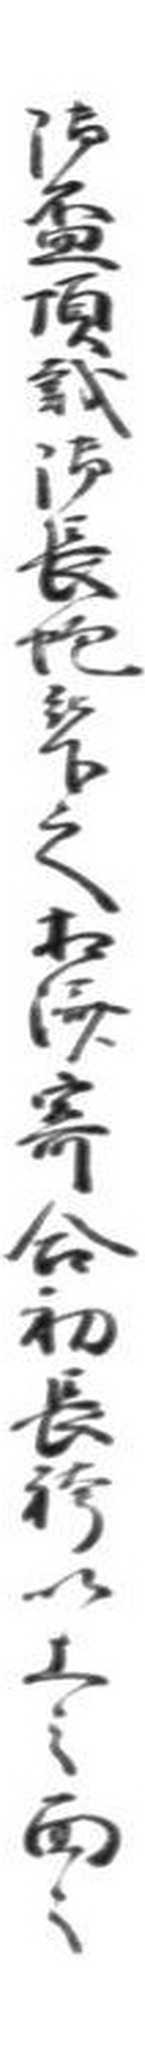御盃頂戴御長蚫被下之相済寄合初長袴以上之面々
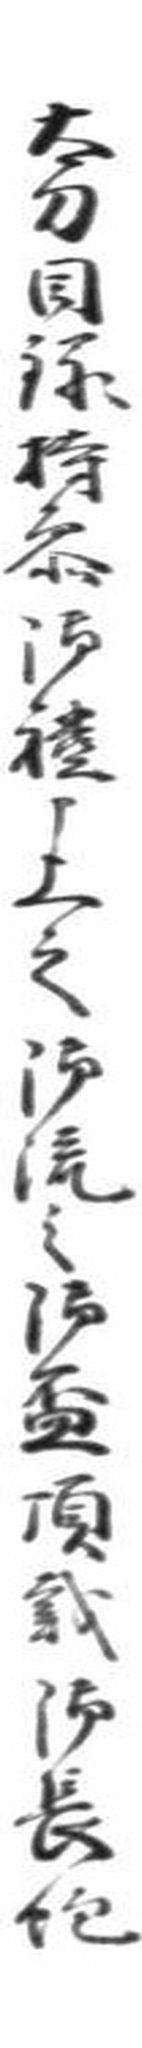太刀目録持参御礼申上之御流之御盃頂戴御長蚫

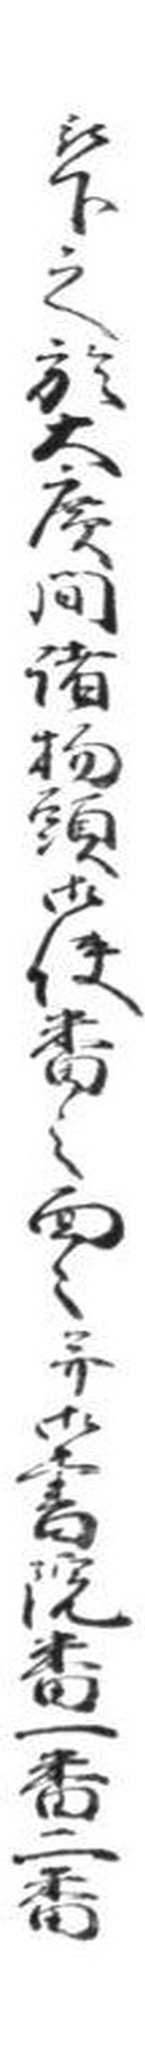被下之於大広間諸物頭御使番之面々并御書院番一番二番
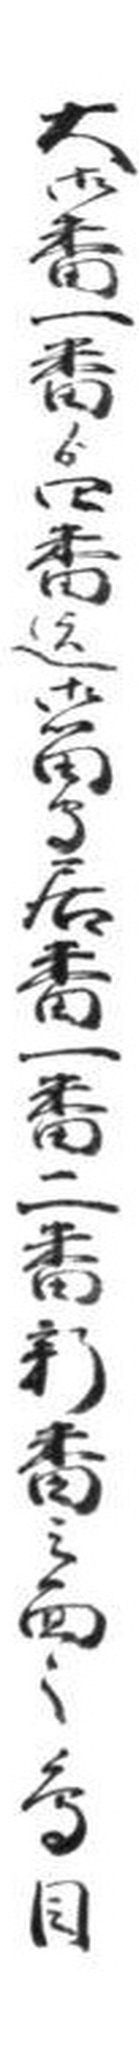大御番一番ゟ四番迄御留守居番一番二番新番之面々鳥目
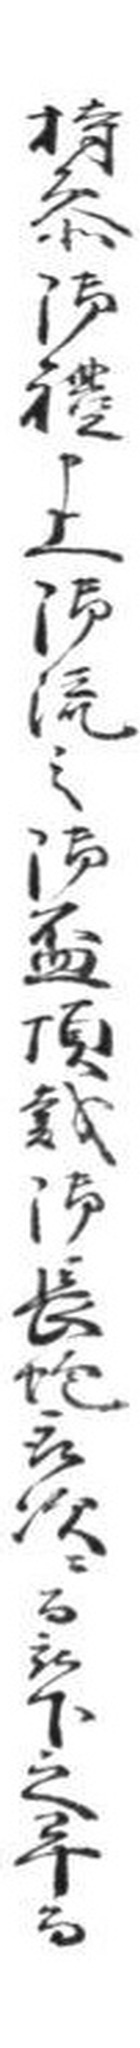持参御礼申上御流之御盃頂戴御長蚫取次ニ而被下之畢而
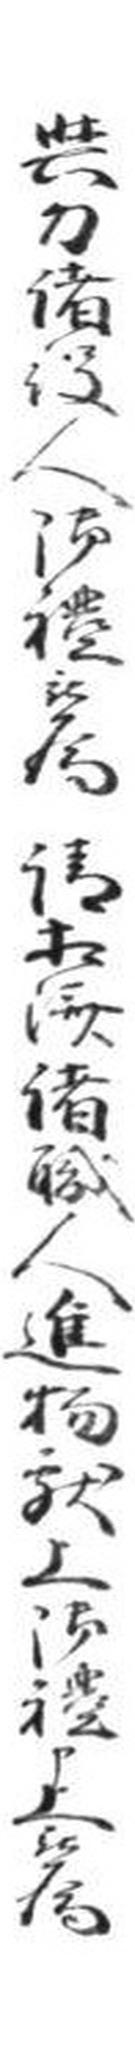与力諸役人御礼被為請相済諸職人進物献上御礼申上被為
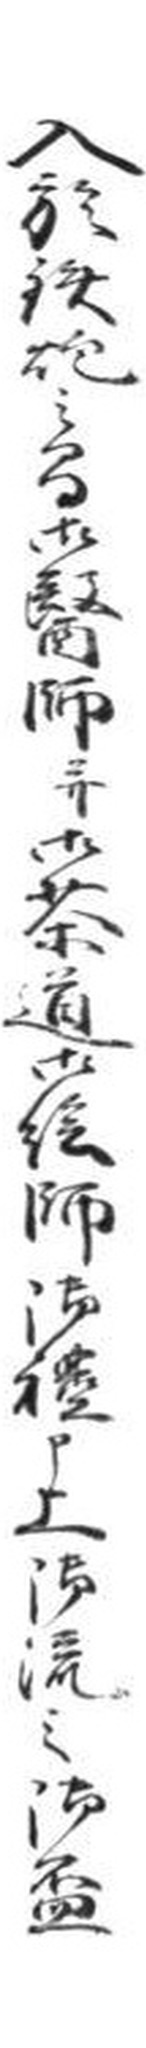入於鉄砲之間御医師并御茶道御絵師御礼申上御流之御盃
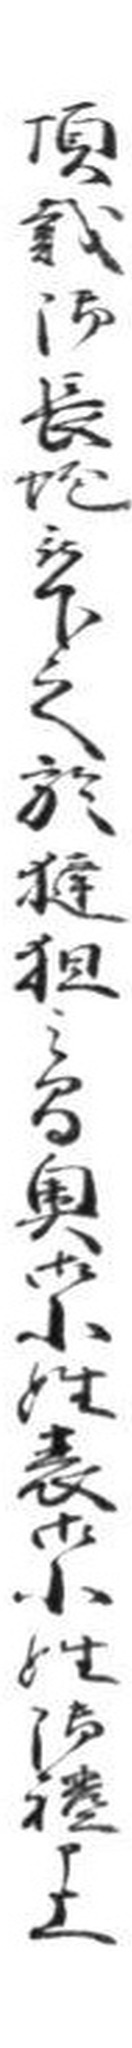頂戴御長蚫被下之於韃靼之間奥御小姓表御小姓御礼申上
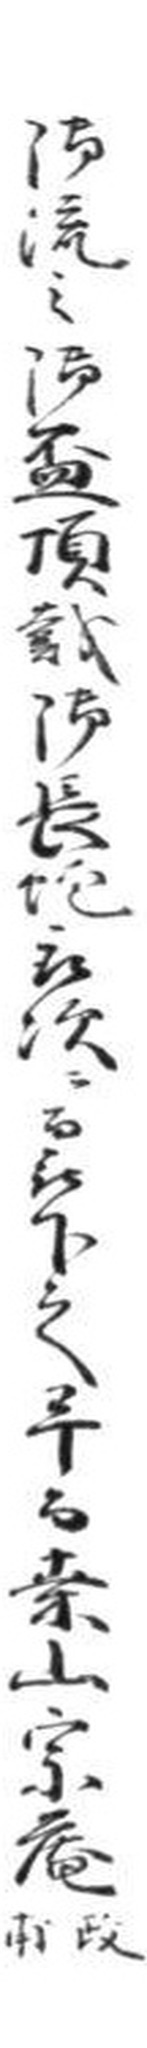御流之御盃頂戴御長蚫取次ニ而被下之畢而桒山宗庵政甫
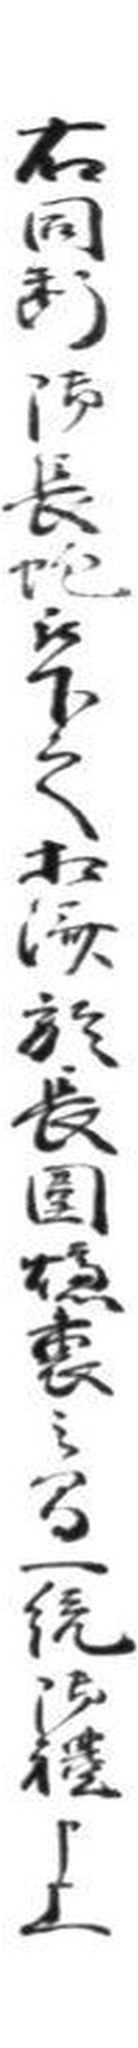右同断御長蚫被下之相済於長囲爐裏之間一統御礼申上
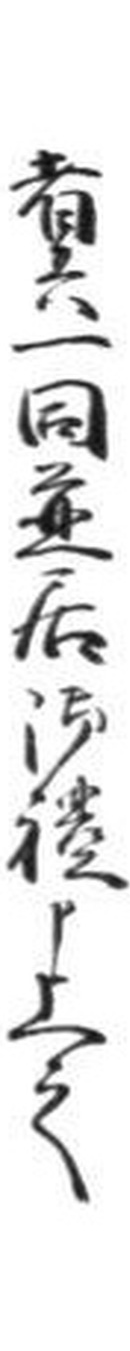者共一同並居御礼申上之
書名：家譜 十七 吉品公 従元禄元年到同二年
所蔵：福井県文書館 Fukui Prefectural Archives
